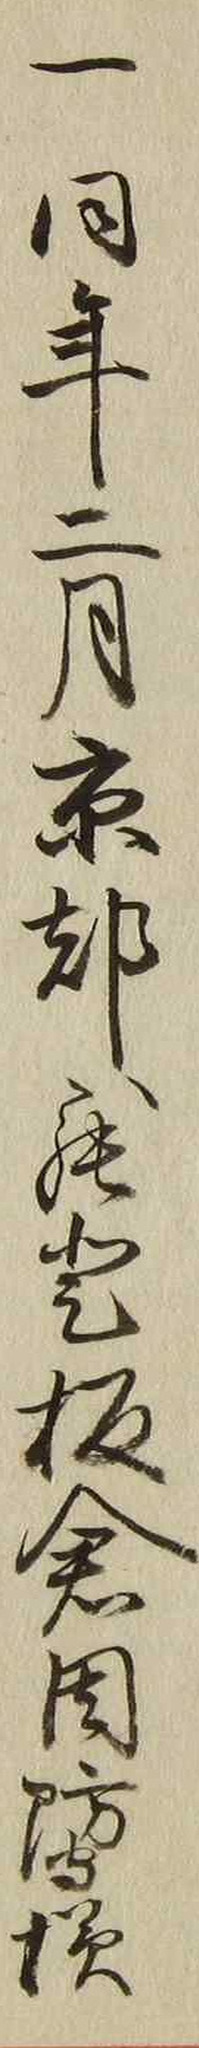一同年二月京都へ罷登板倉周防守様
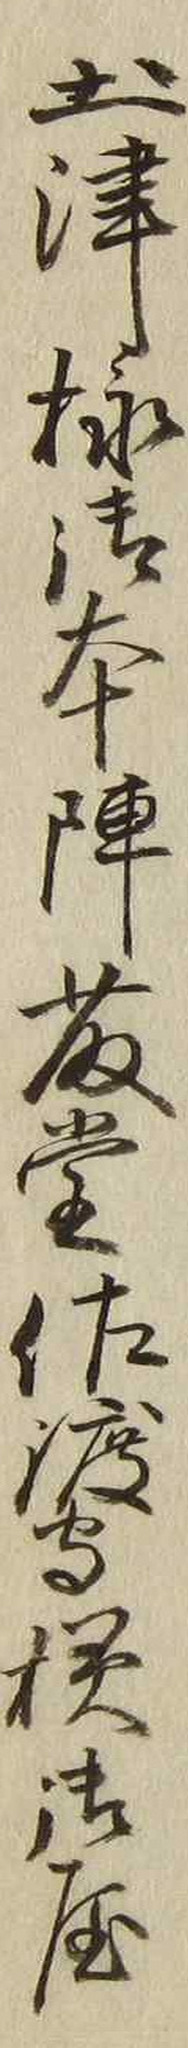土津様御本陣藤堂佐渡守様御屋
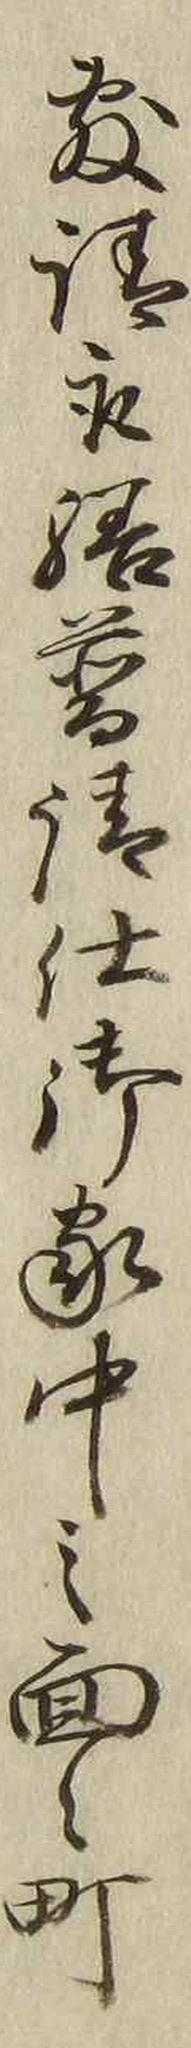敷請取繕普請仕御家中之面々町
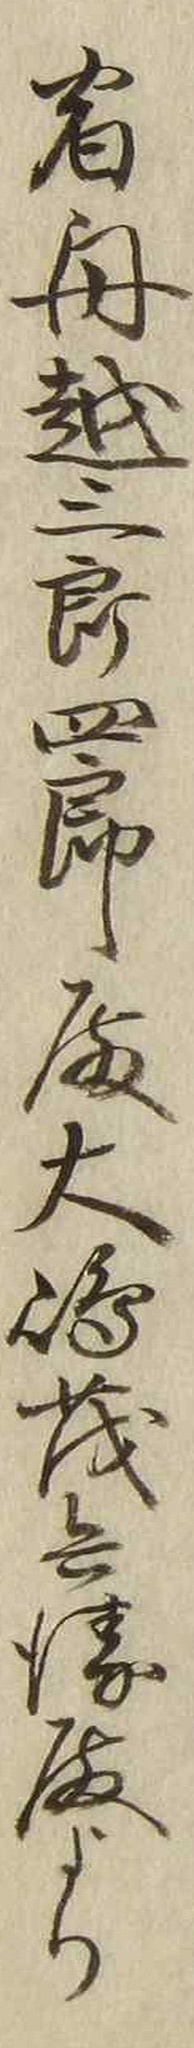宿船越三郎四郎殿大嶋茂兵衛殿より

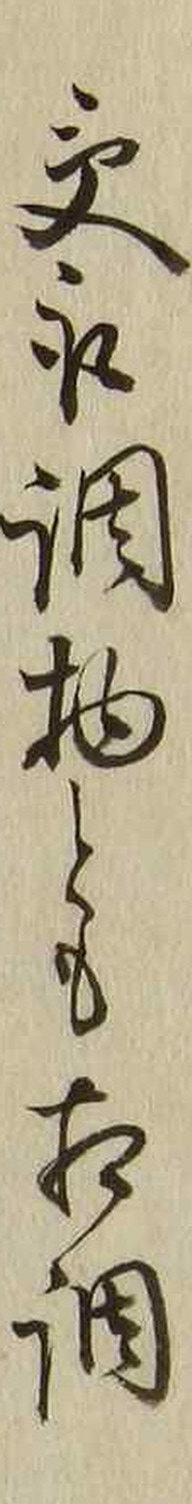受取調物とも相調
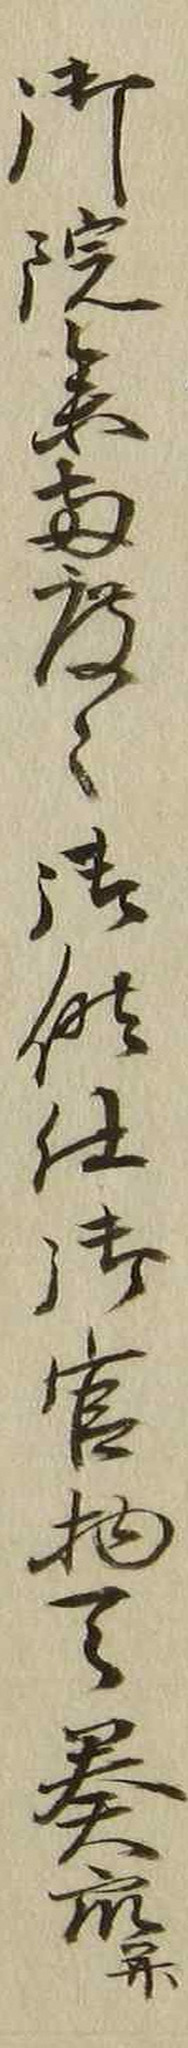御院参両度々御供仕御官物天奏衆幷
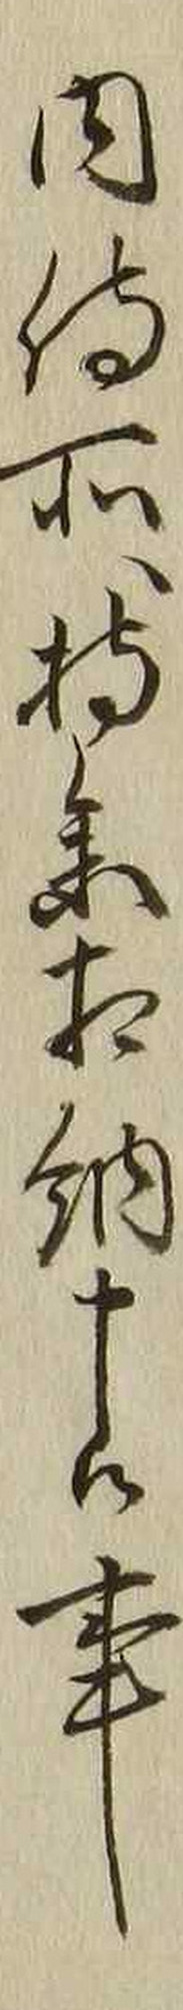内侍所へ持参相納申候事
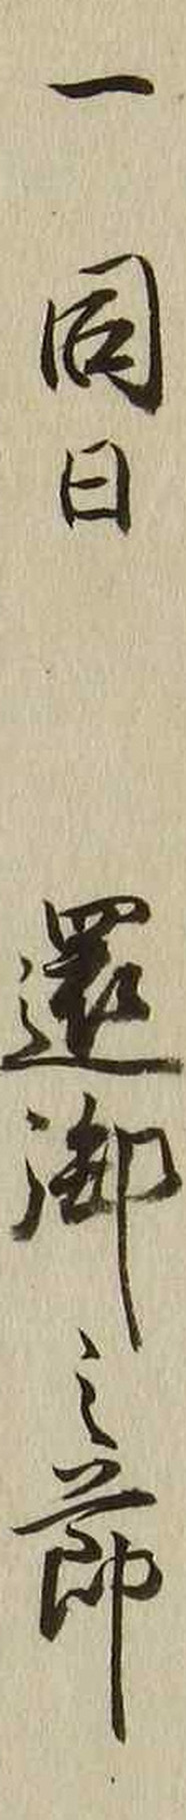一同日還御之節
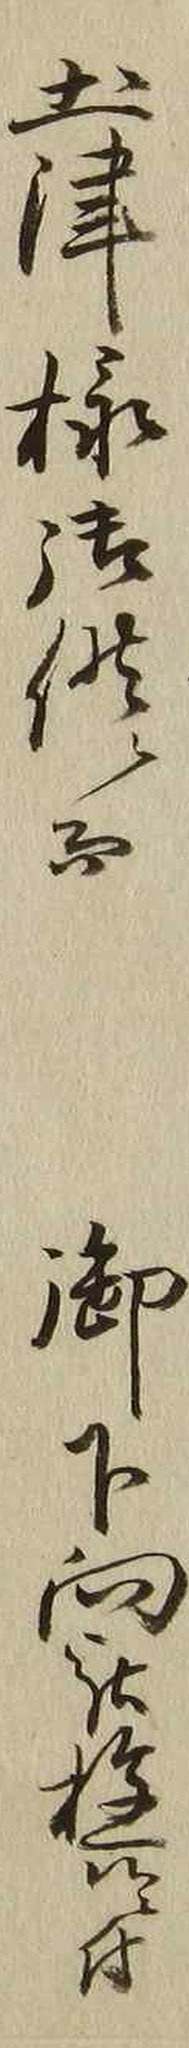土津様御供ニ而御下向被遊候ニ付
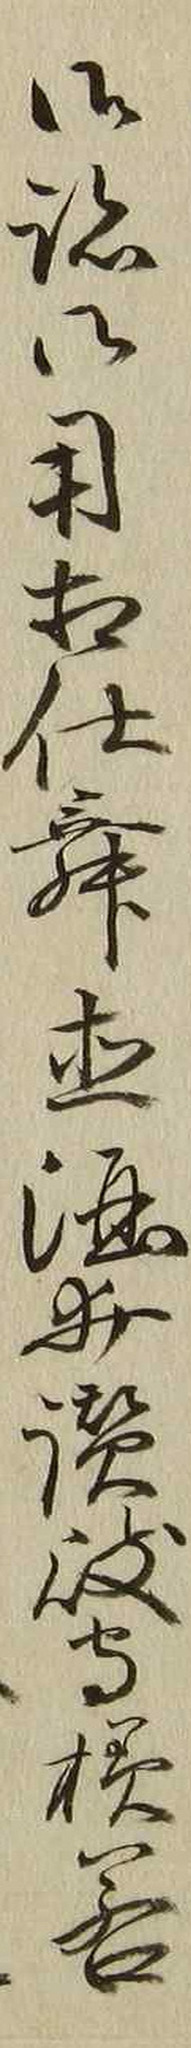御跡御用相仕舞直酒井讃岐守様若
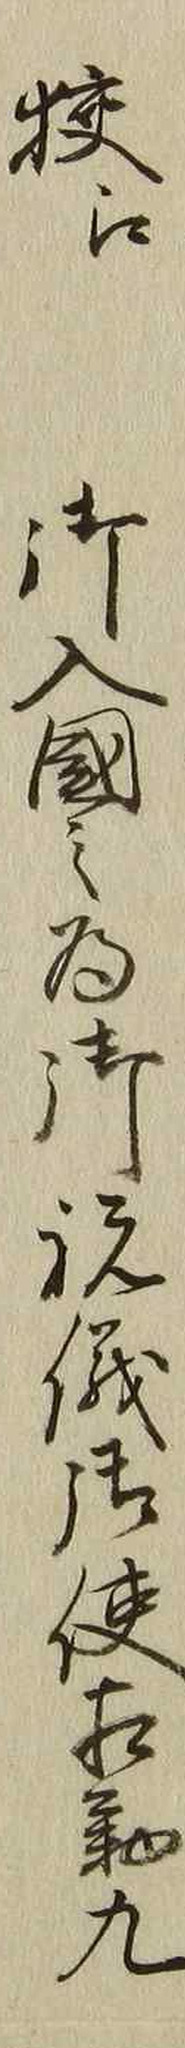狭江御入国之為御祝儀御使相勤九
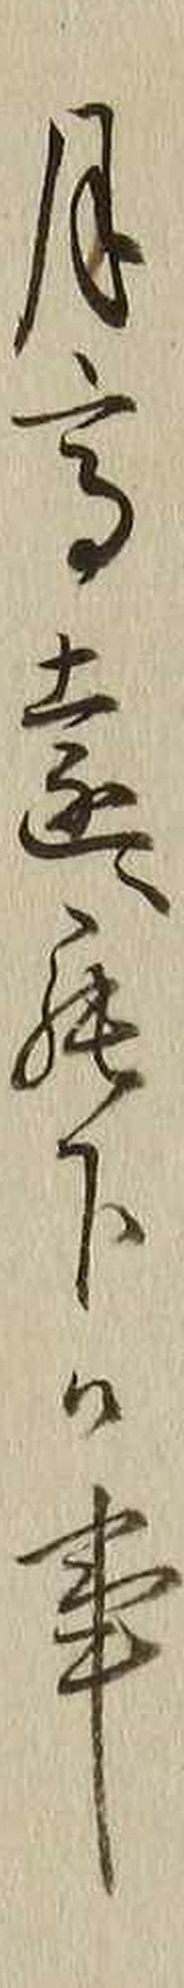月高遠へ罷下候事
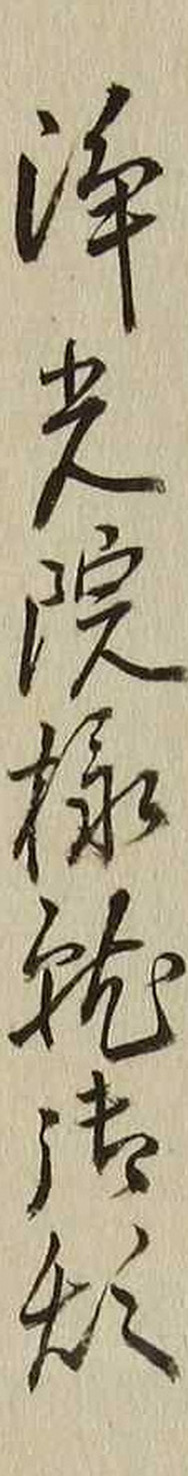浄光院様就御煩
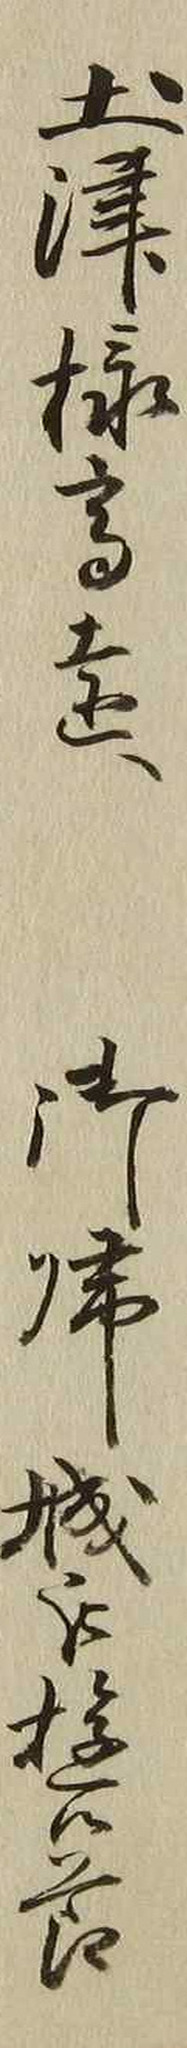土津様高遠へ御帰城被遊候節
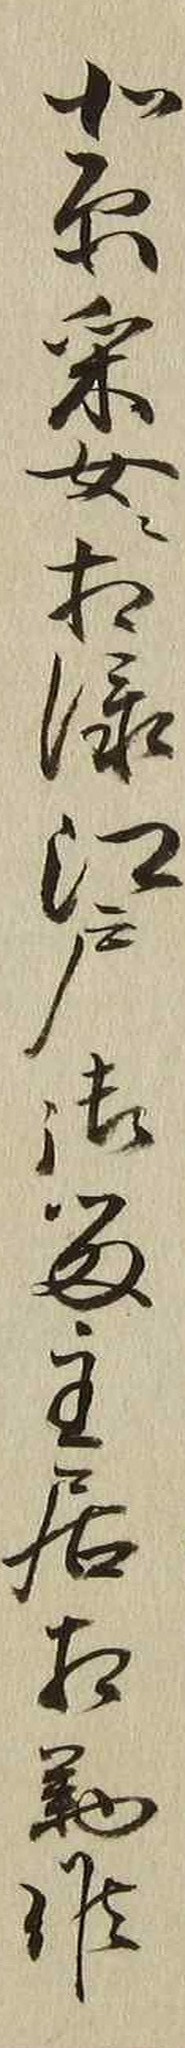北原采女ニ相添江戸御留主居相勤候
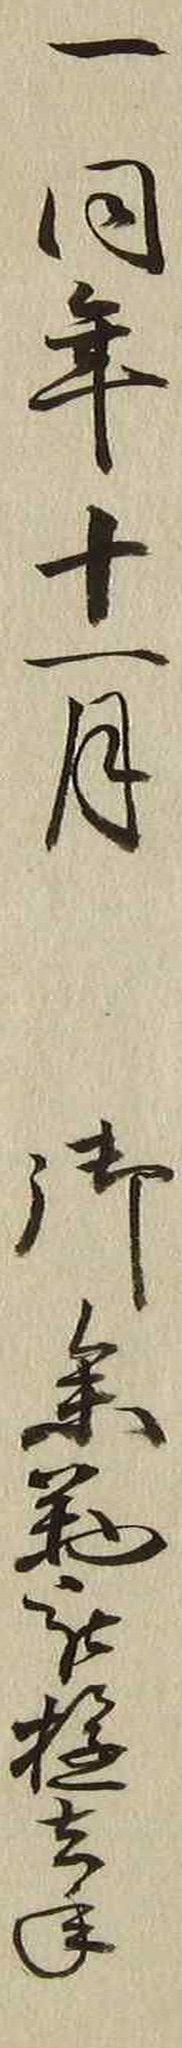一同年十一月御参勤被遊去年
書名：諸士系譜　巻之60　と之部3
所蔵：会津若松市立会津図書館
